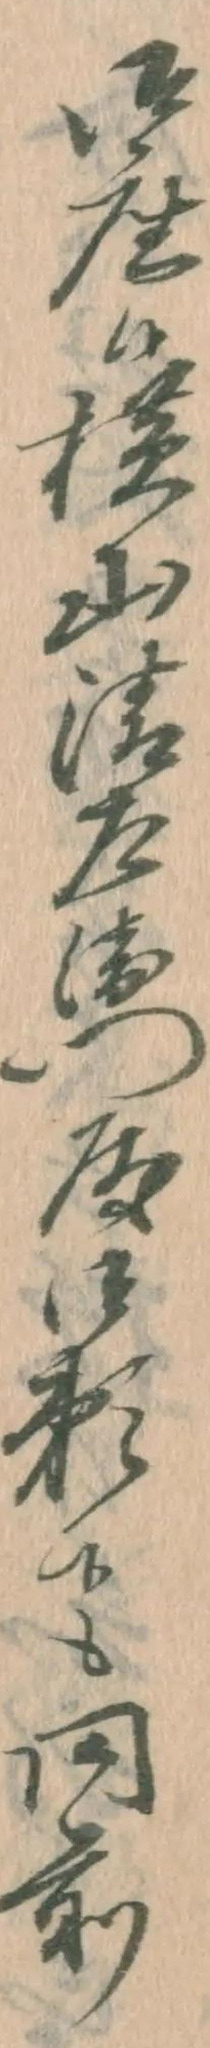御座候横山清左衛門殿御頼候も同前
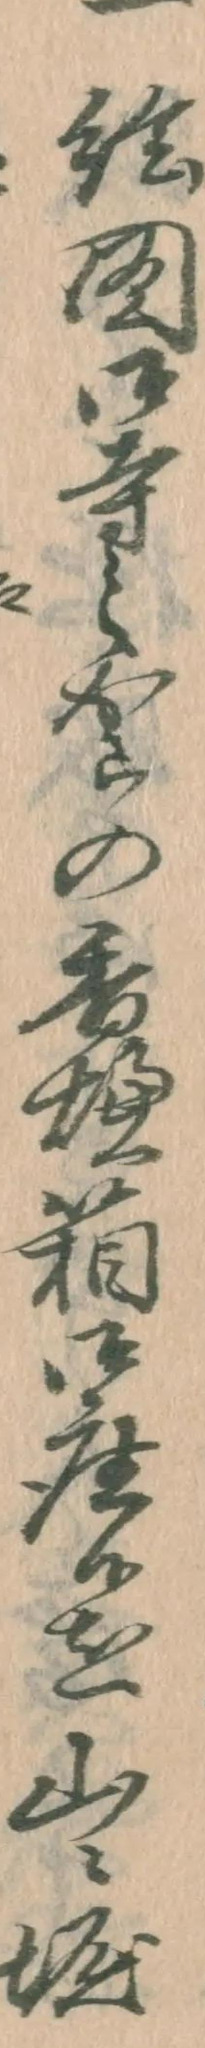一絵図御寺之からの香爐箱御座候を山に堀
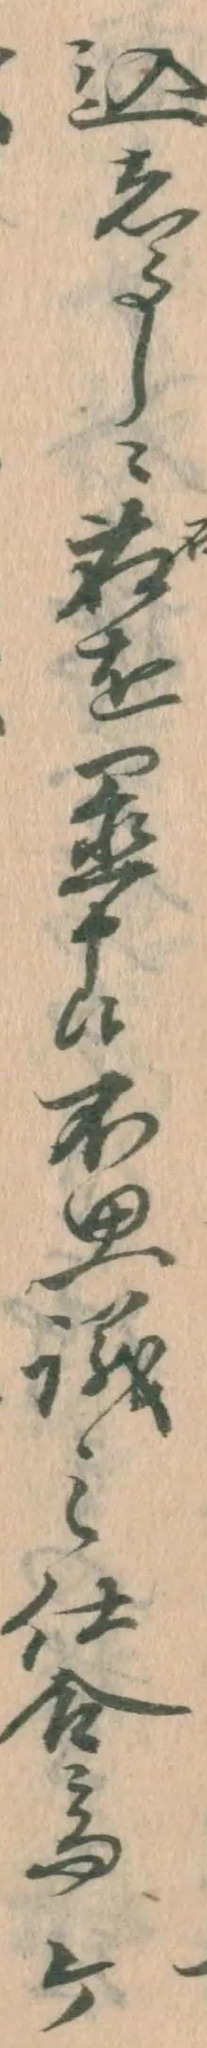込志るしに石を置申候不思議之仕合に而け
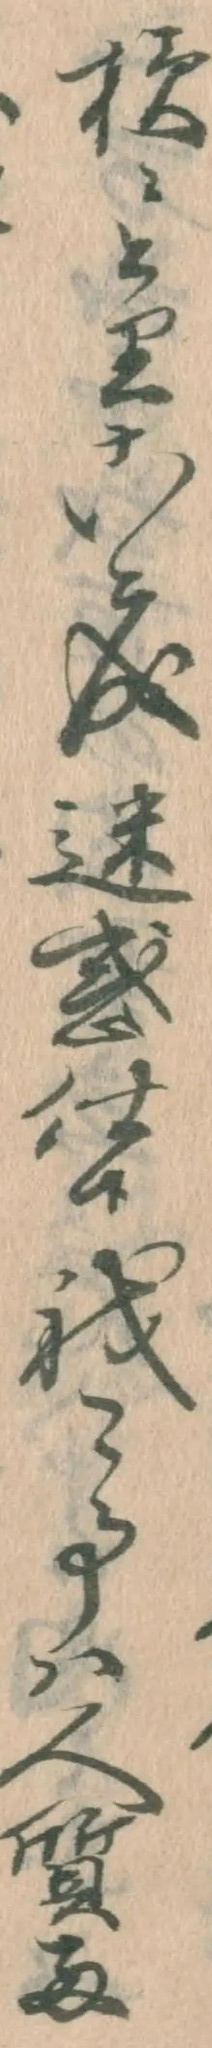様にと里古被成迷惑仕候我々事は人質両
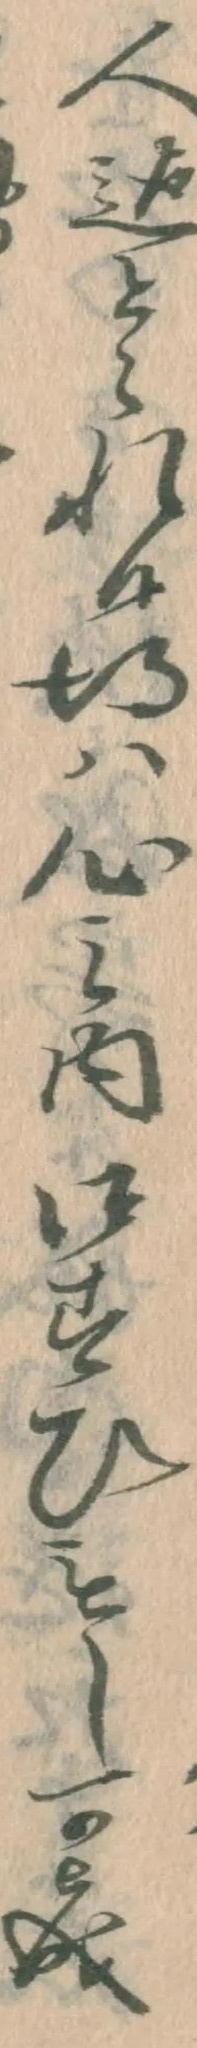人迄とられ候得は心之内御春ひもし可被成
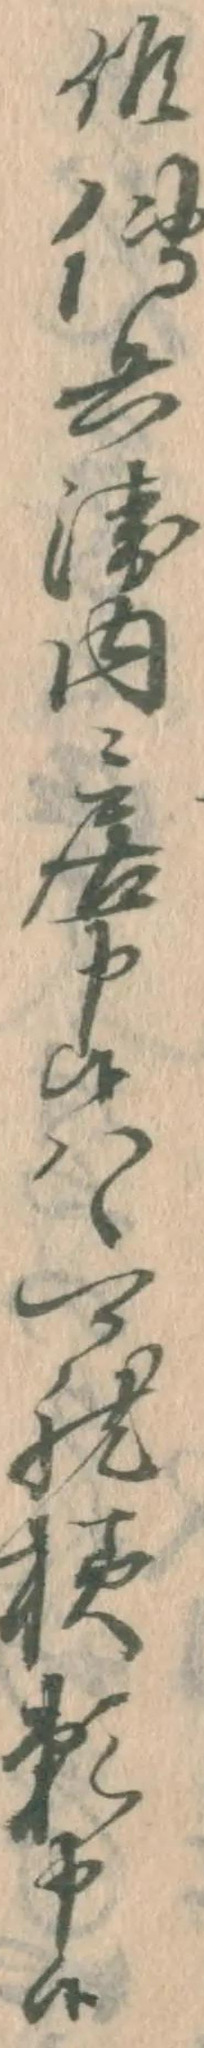候伝兵衛内に居申候はゝ可然様頼申候
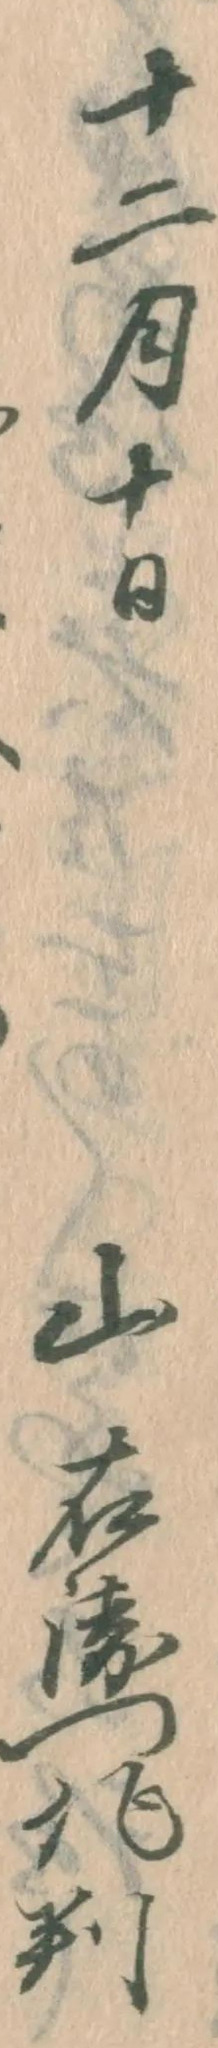十二月十日山右衛門作判
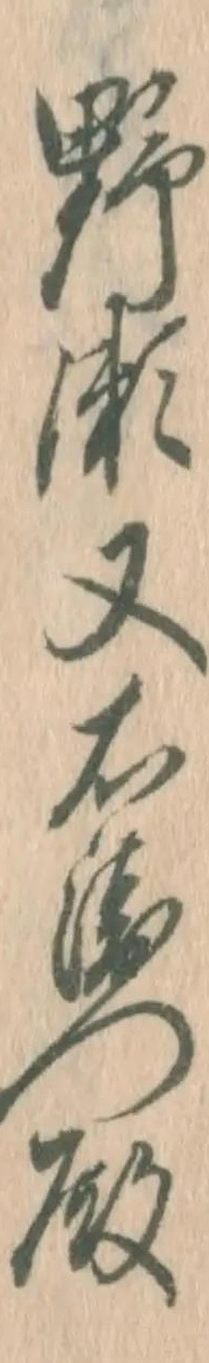野瀬又右衛門殿
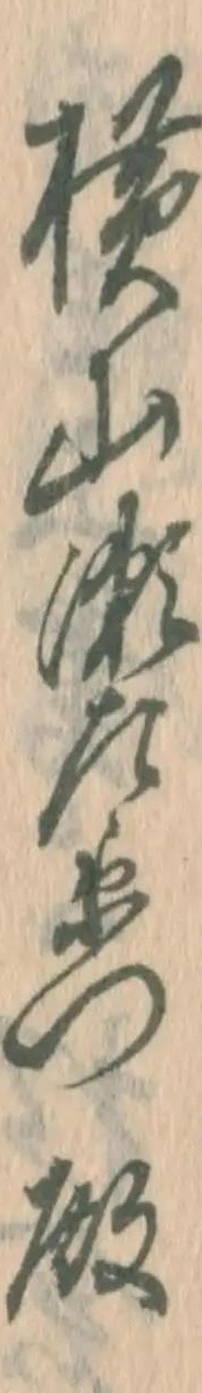横山瀬左衛門殿

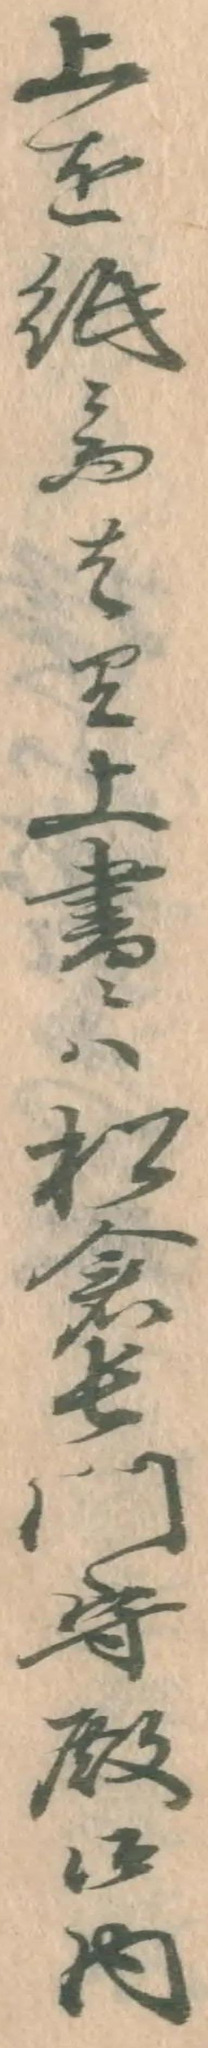上を紙に而者里上書には松倉長門守殿御内
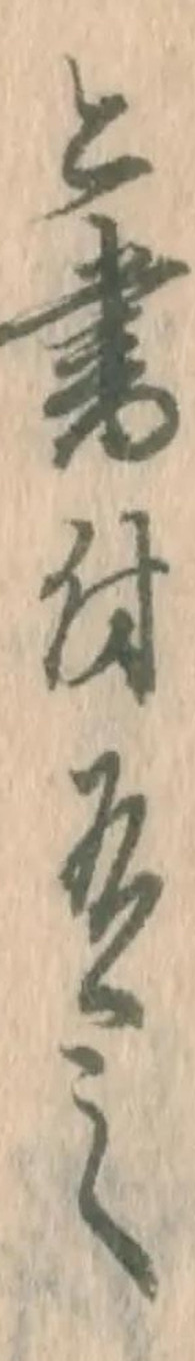と書付有之
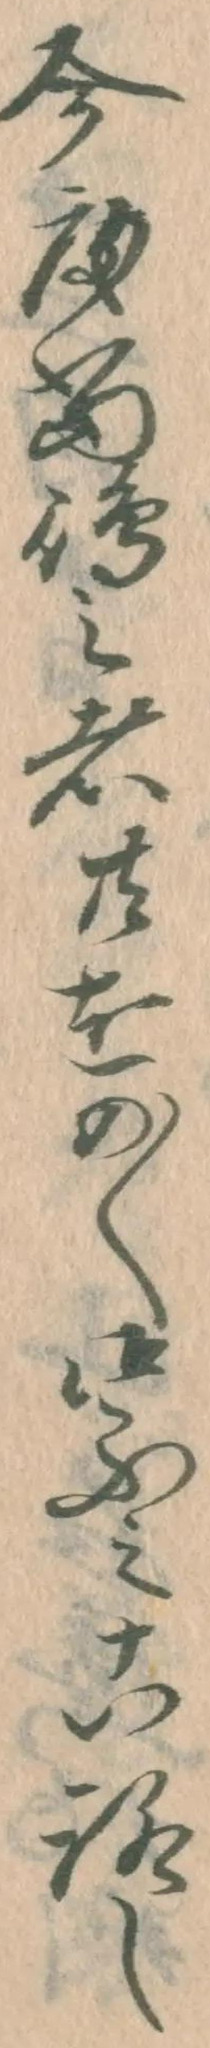今度当島之者共をの〳〵御ふみ古路し
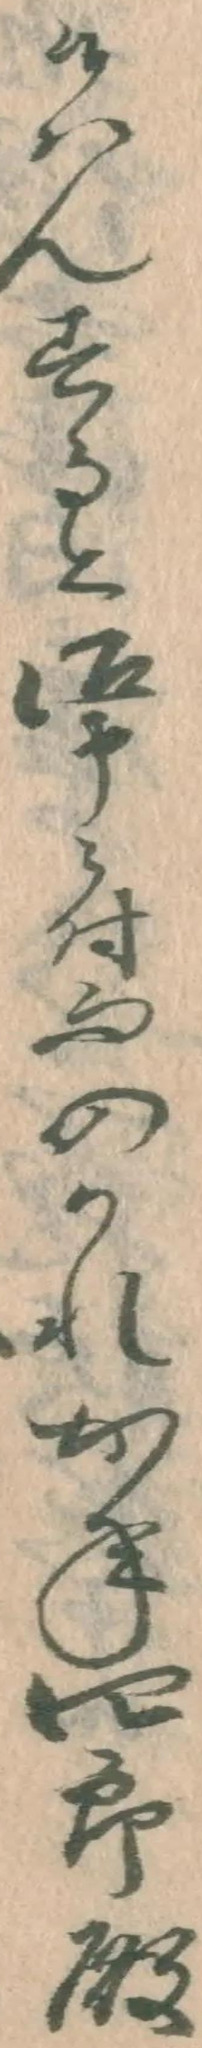候はん春ると御申に付而のかれ加年四郎殿
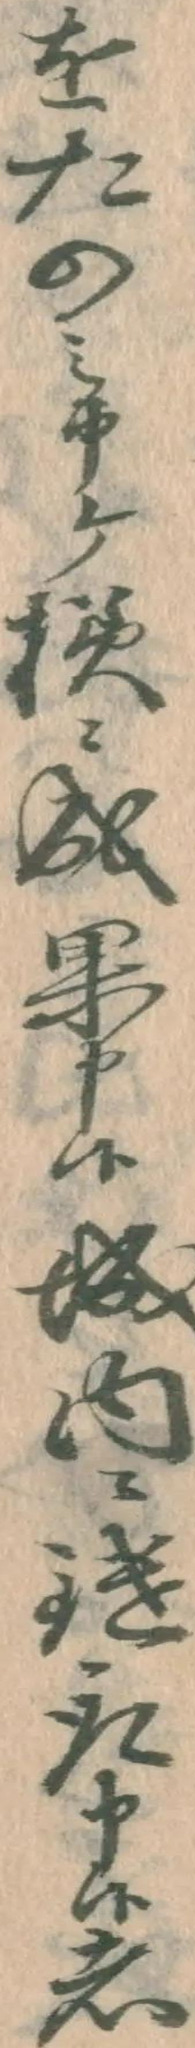をたのみ申け様に成果申候城内に鑓取申候者
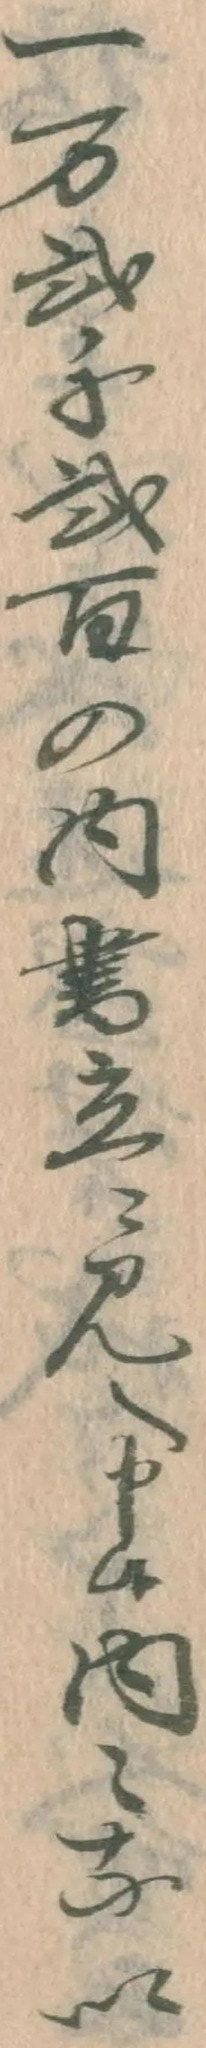一万弐千弐百の内書立に見へ申候内にな以
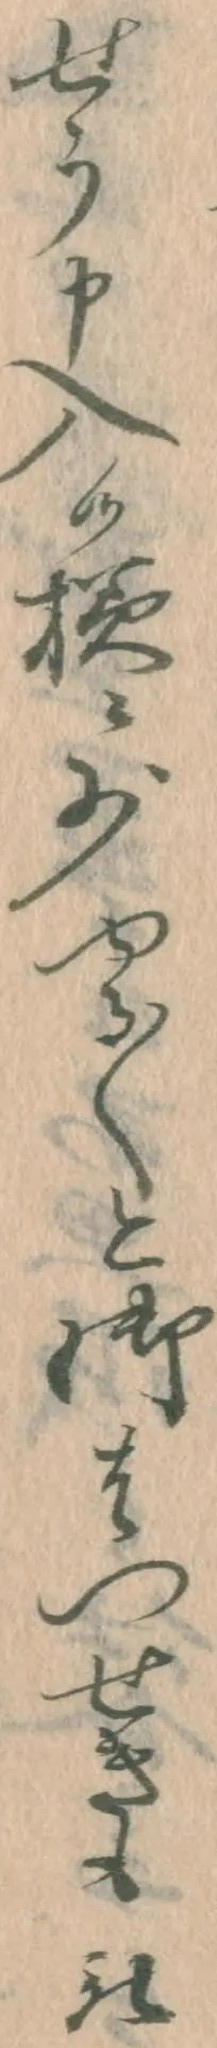せう申入候様に少ゆる〳〵と御者つせきも被
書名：切支丹御退治記 49巻. [5]
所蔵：国立国会図書館 National Diet Library, JAPAN
